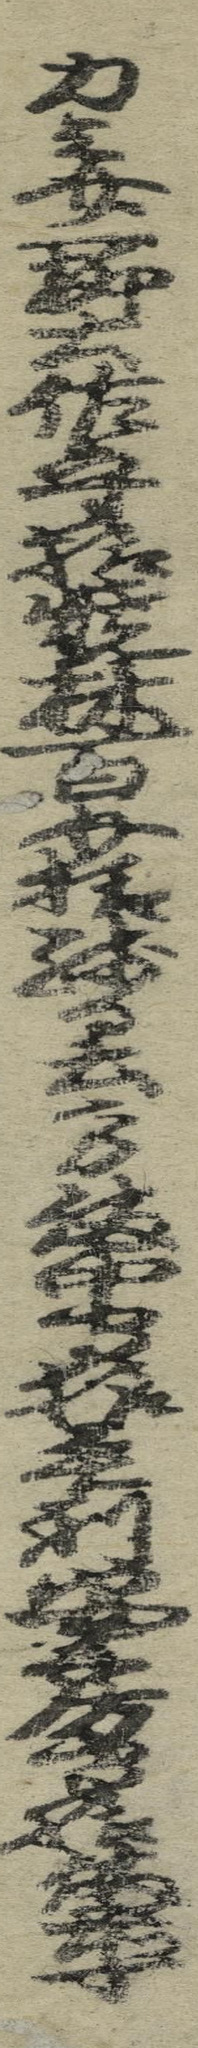力之介一柳土佐守様焼林百介様残る土方備中守様毛利安房守様備前丁
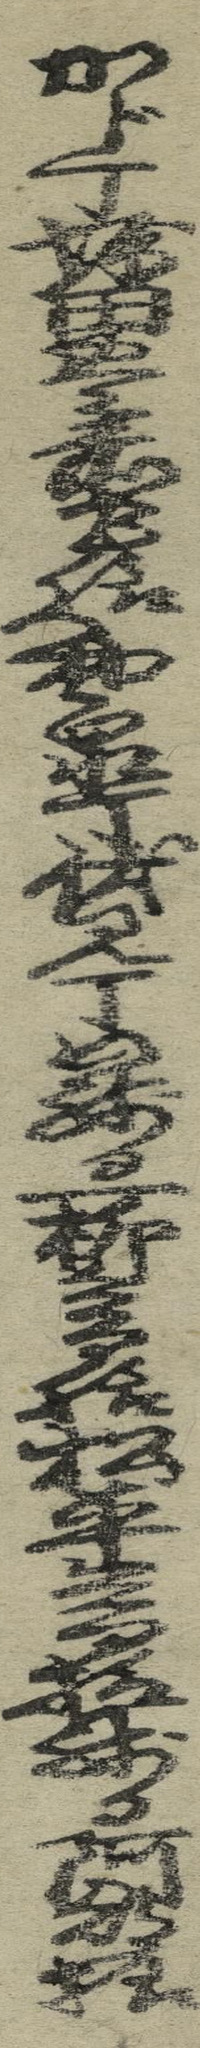かが丁堀田豊前守様和泉丁伏見丁は残る一柳？様松平？様残る阿部様
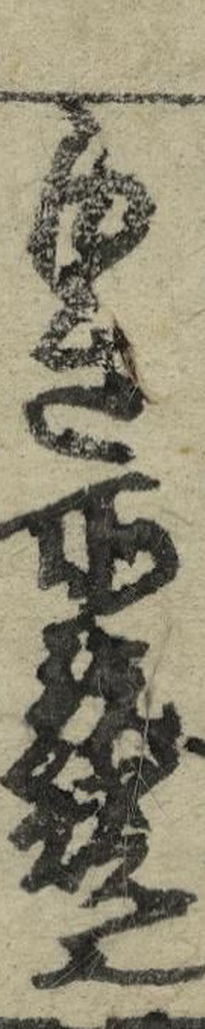白き所類焼也
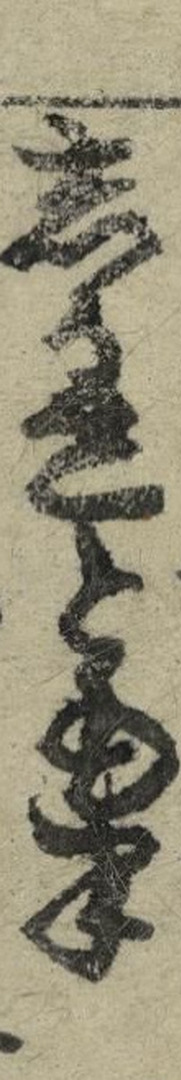しかれとも半
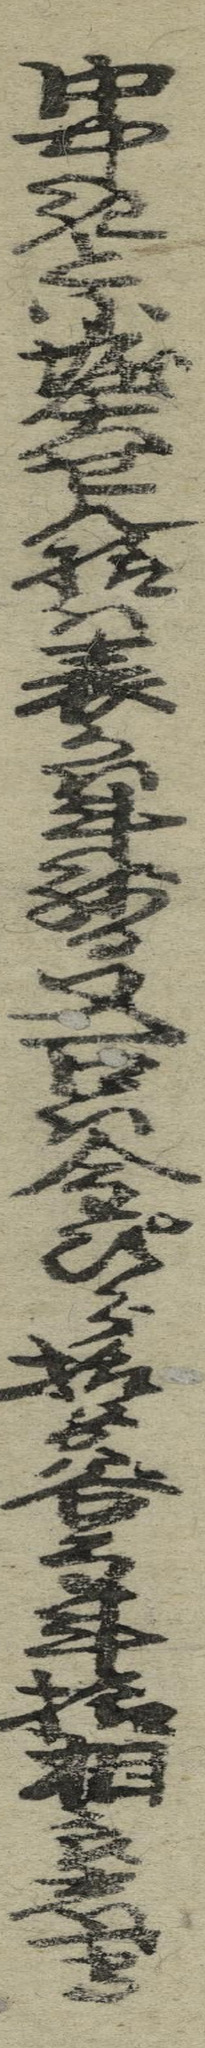中やしきと小堀大せん様は表がわ斗残る又一口は金ぴら様ゟ谷ゐ様相良志摩守
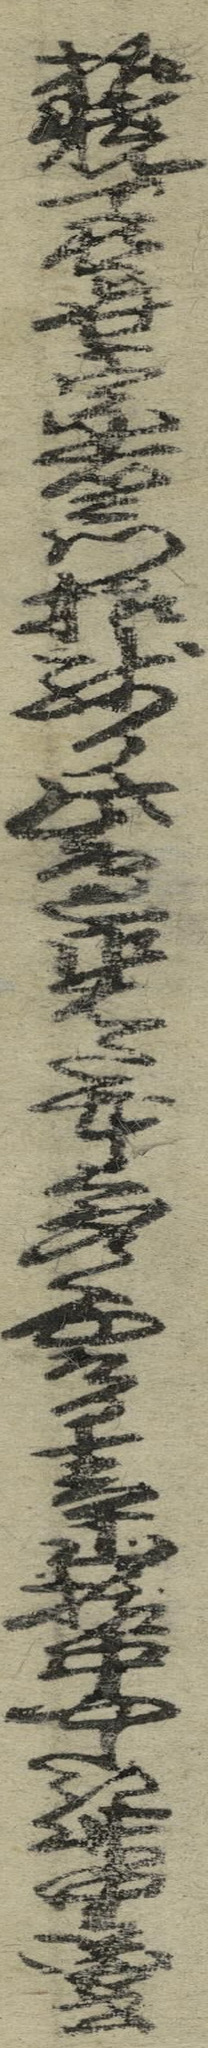様焼て？？宗右衛門様残り此邊御はた本多くやける青山様中やしき？？？
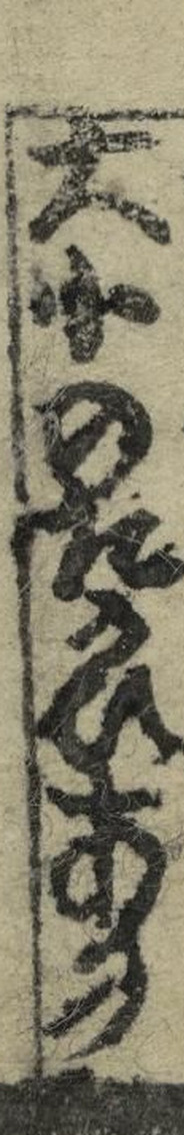大小のさかひあり
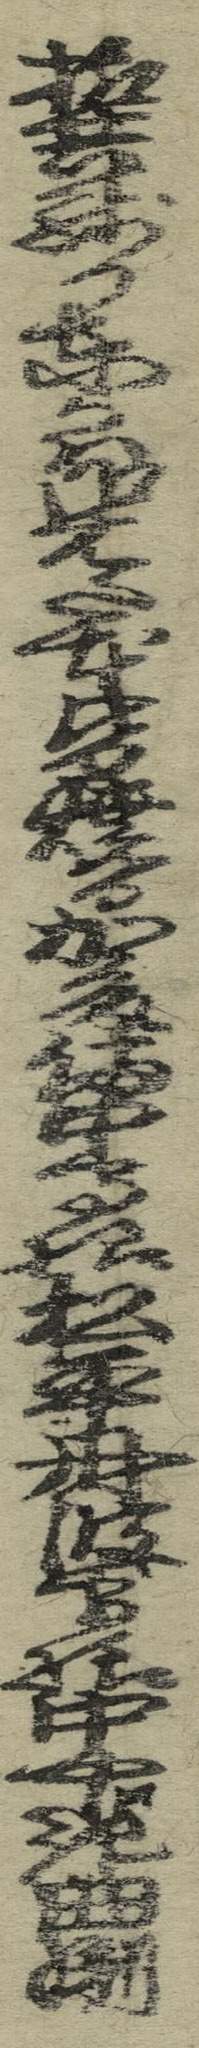様共残る東かは御はた本皆焼ける加藤備中守様松平丹波守様中やしき曲淵
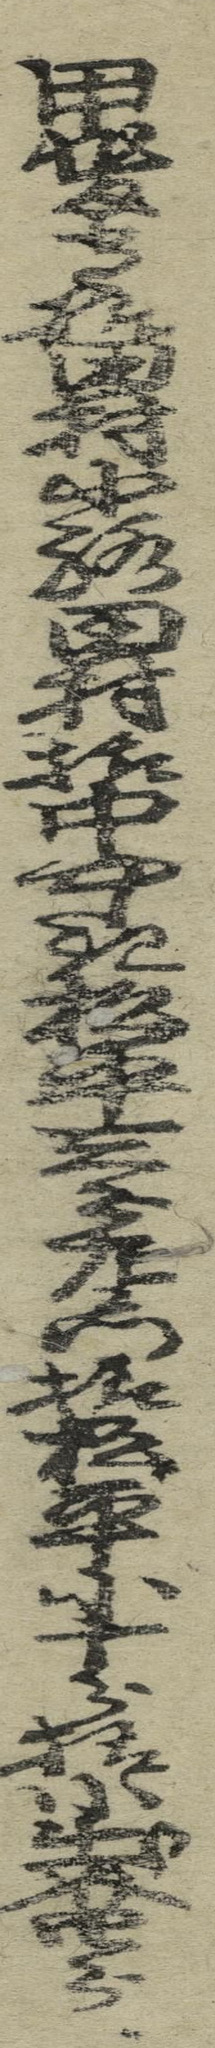甲斐守様田村小路田村様中やき松平三郎九衛門様松平小十郎様小出介四郎
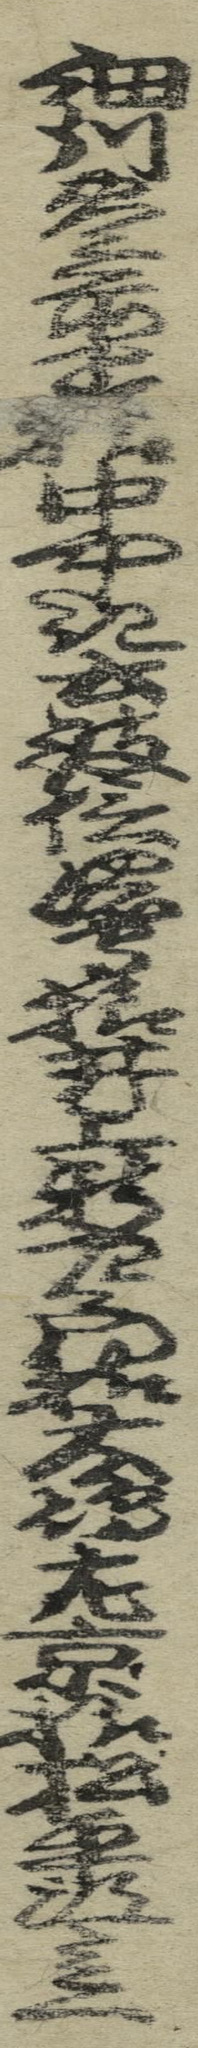細川豊前守様中やしき土岐信濃守様井上新左衛門様大嶋左京様松平次兵衛
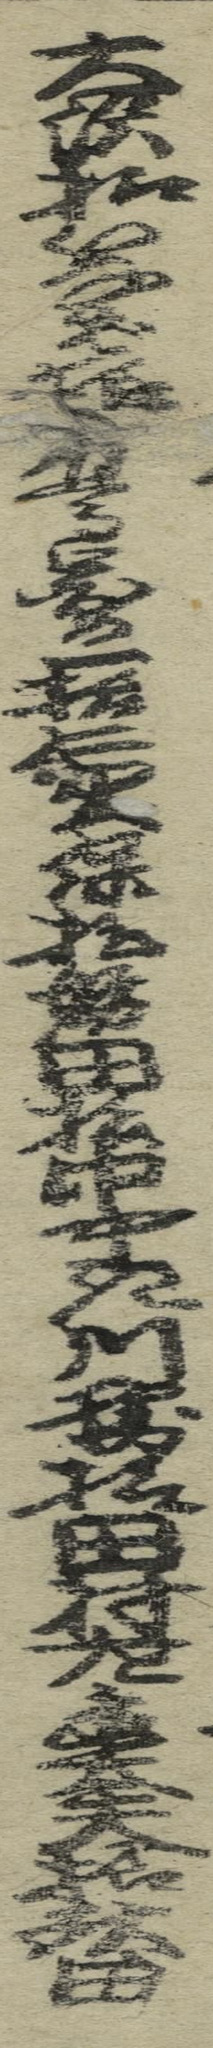大沢様いなば様有馬図書様二賀保様勢田様中やき川勝様田村左京大夫様秋田
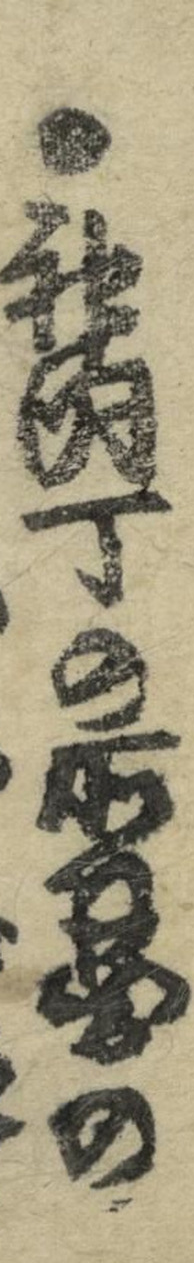●神明丁の所図の
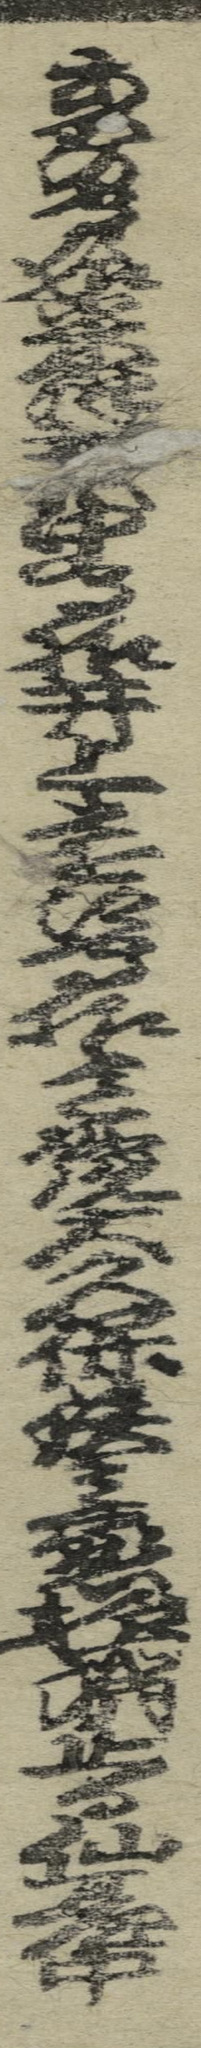あわの守様米津越中守様井上遠江守様迄焼大久保鉄之丞様消止る仙台中
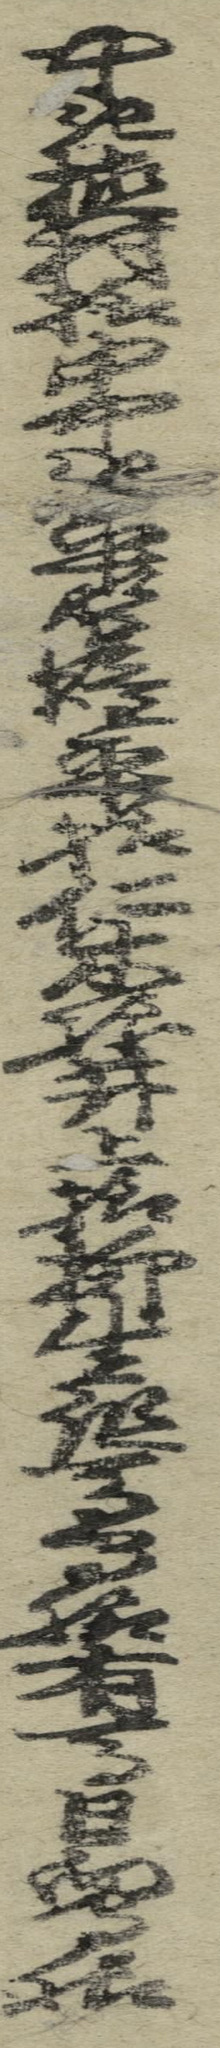やしき植村様中やしき平野権平様仁木様井上様柳生但馬守様有馬日向守様
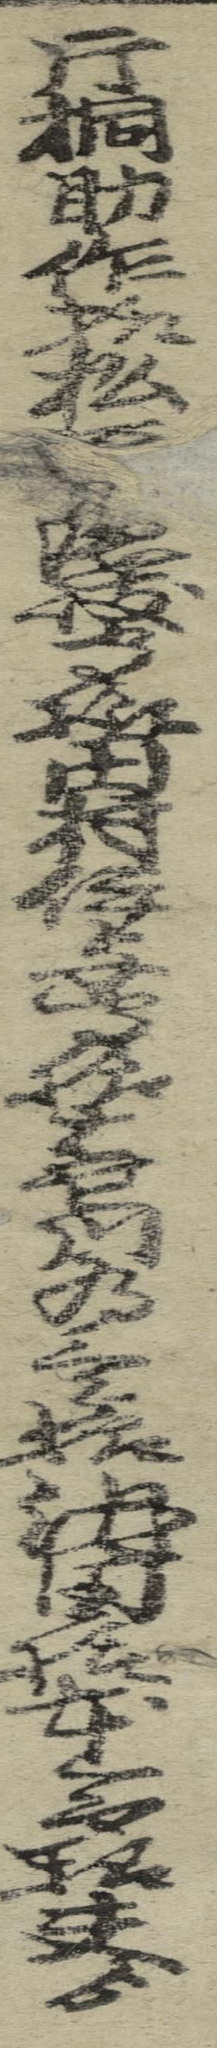片桐助作様松平隠岐守様田村伊与守様はせ川為三郎様池田様本多様夫ゟ
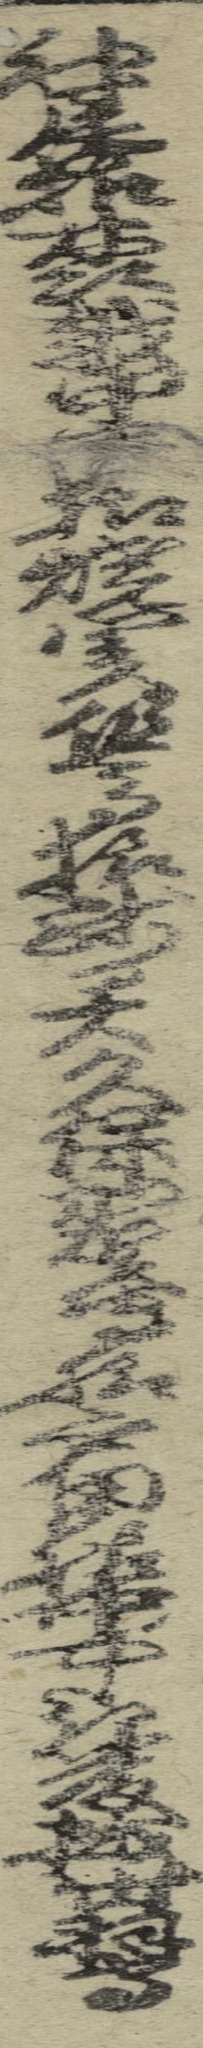神尾様森越中守様焼ル関但馬様残る大久保加賀守様戸田様中やしき藤掛出羽守
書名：[嘉永三年二月の江戸大火に関する瓦版]
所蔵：東京大学地震研究所図書室 Earthquake Research Institute Library, The University of Tokyo, JAPAN
